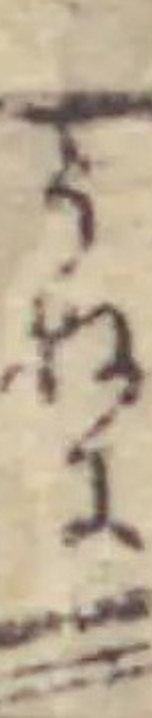うぬに
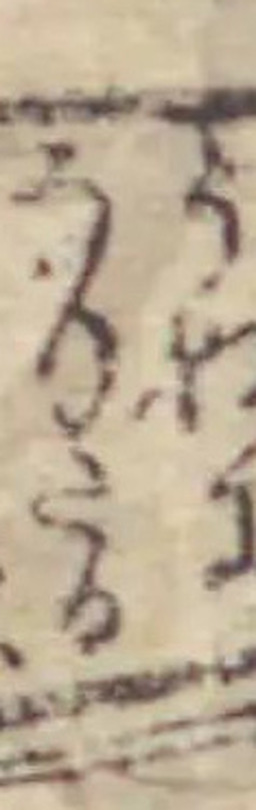なりたる
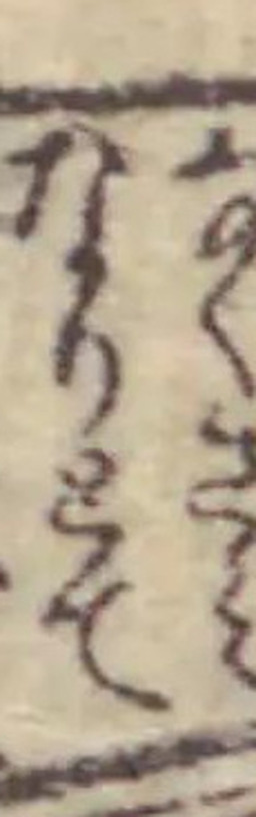なりとて
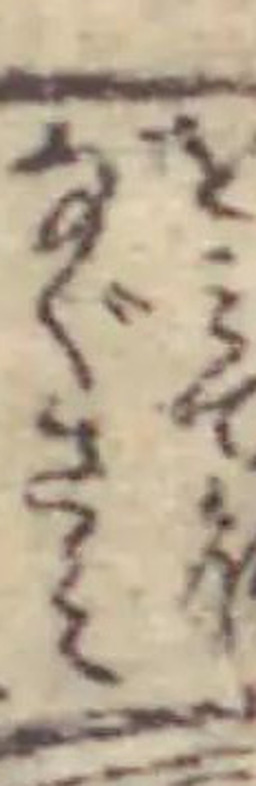なぐさみ
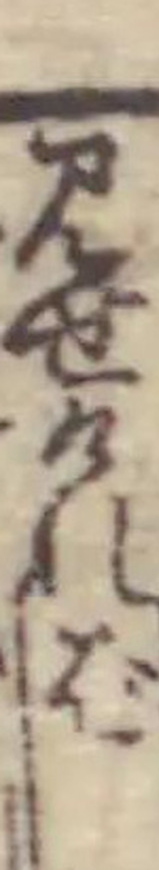見せければ
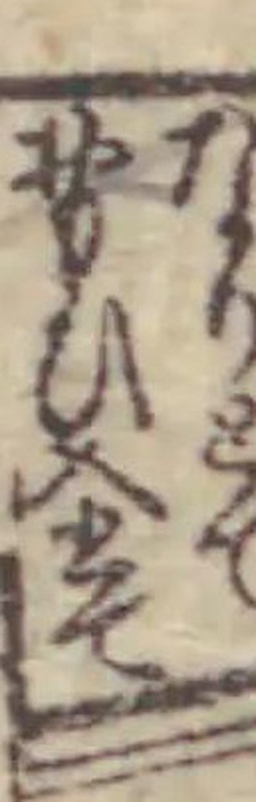おもひ入れ出て
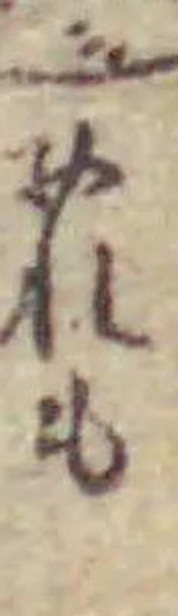おれも
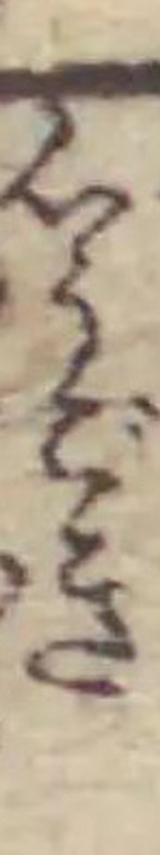心うごき
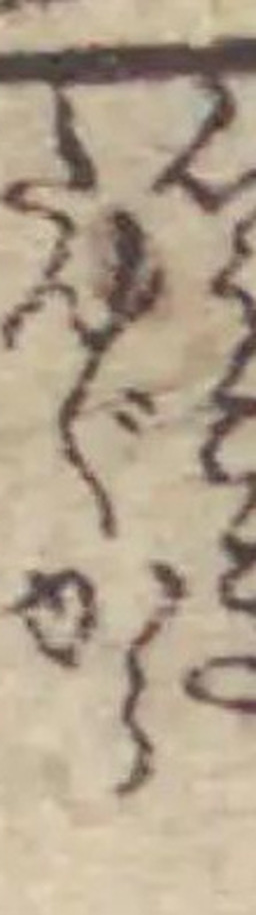たん〴〵から
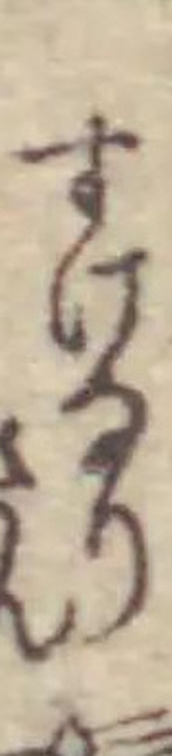すけなり
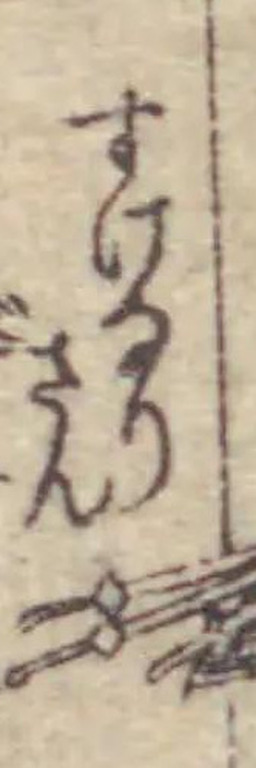すけなり
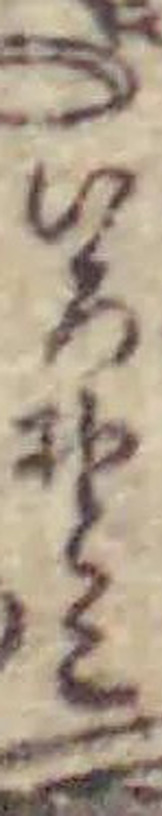いろおとこ
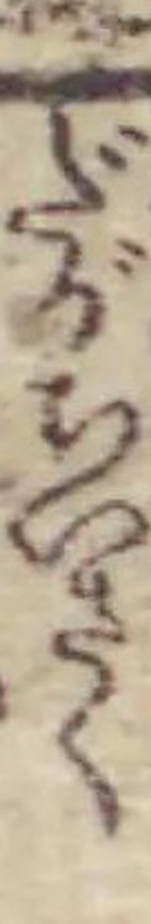だがちいさく
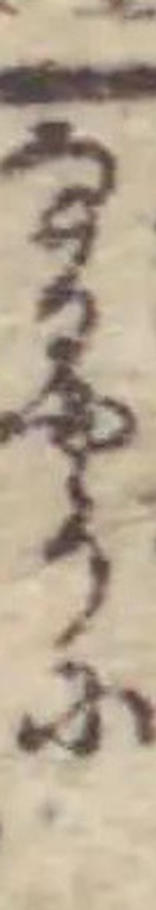なるやうに
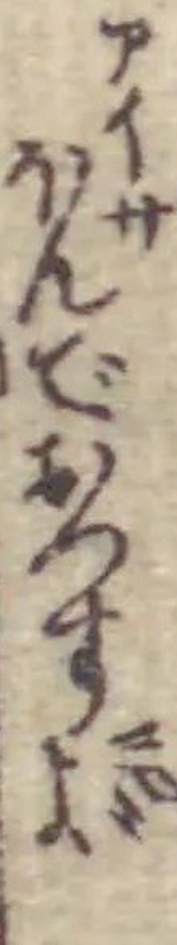ほんでおつすよ
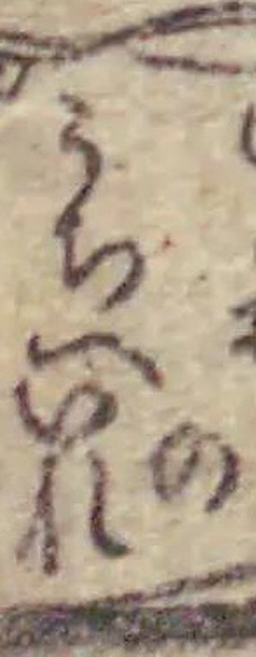うちへいれ
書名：亀山人家妖 3巻
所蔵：国立国会図書館 National Diet Library, JAPAN
